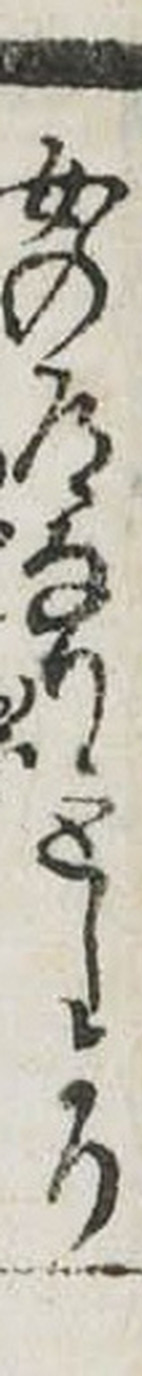女の道なりとしより
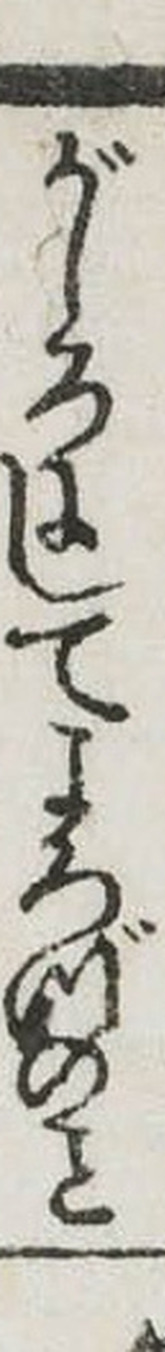がしろにしてよろづのこと
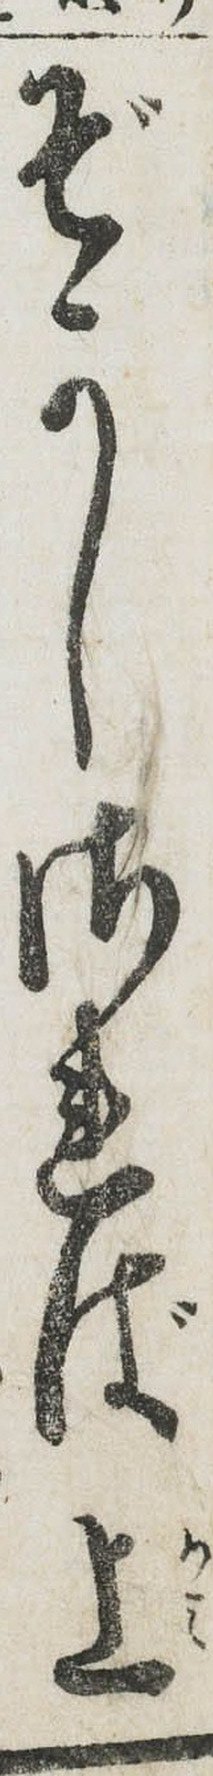ぞかしされば上
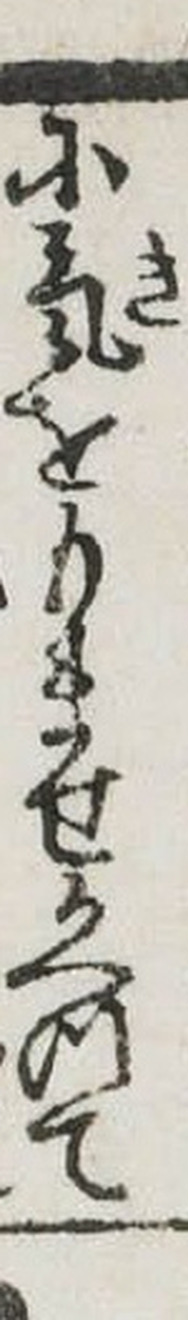に気をもませかへつて
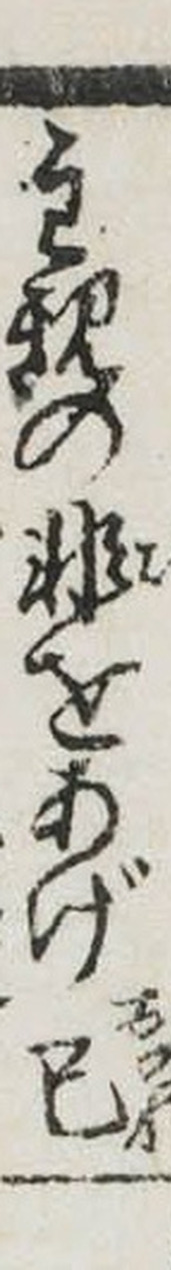主親の非をあげ己
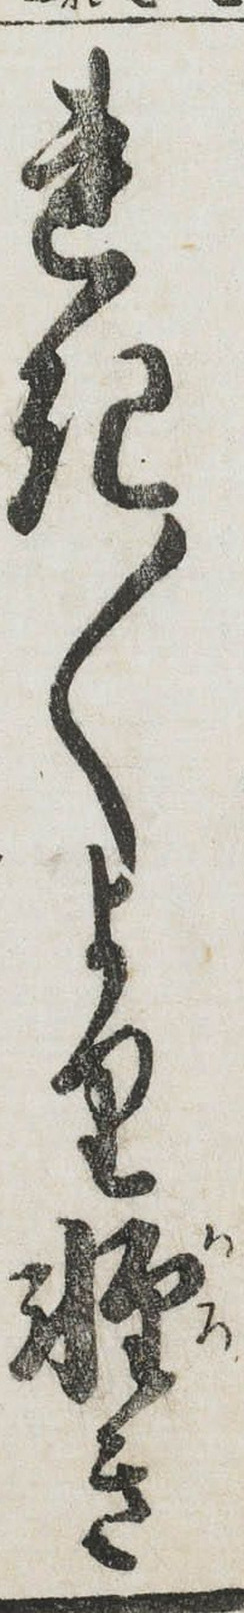れき〳〵より軽き
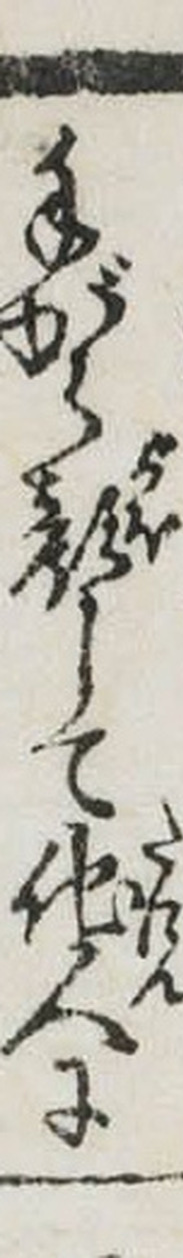手がら顔して他人に
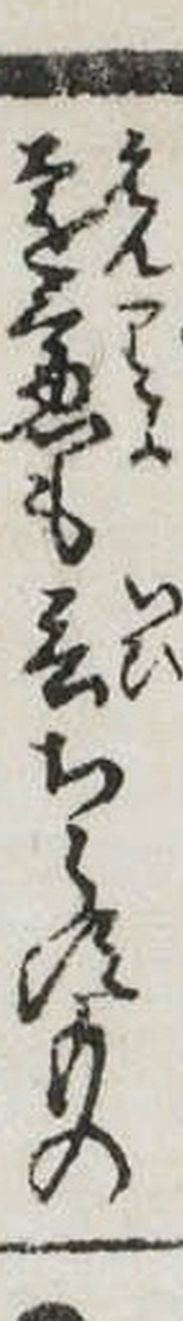遠慮も言ちらすもの
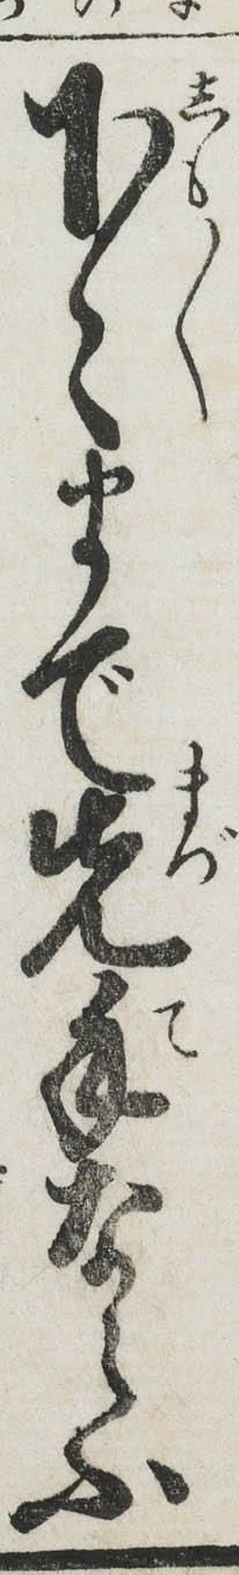下々まで先手ならふ
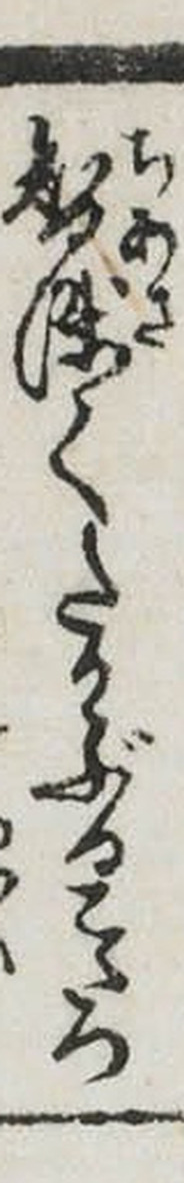智浅くたかぶるこゝろ
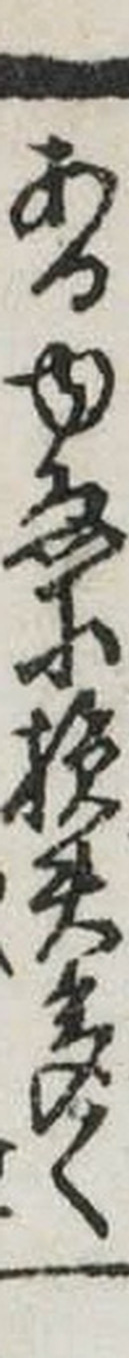あるゆゑに損失多く
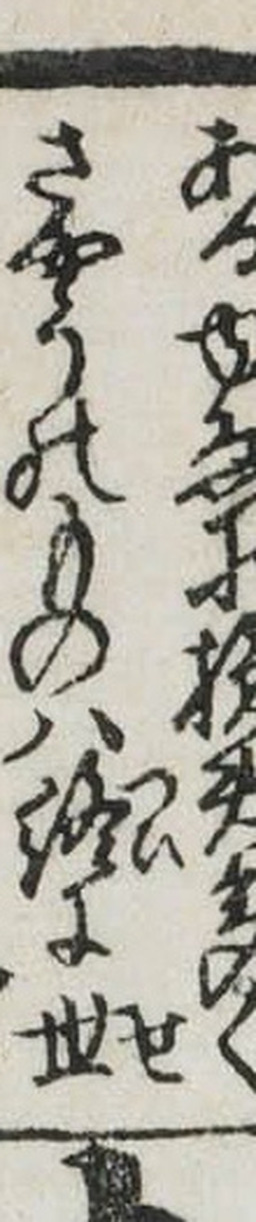さやうのものは終に世
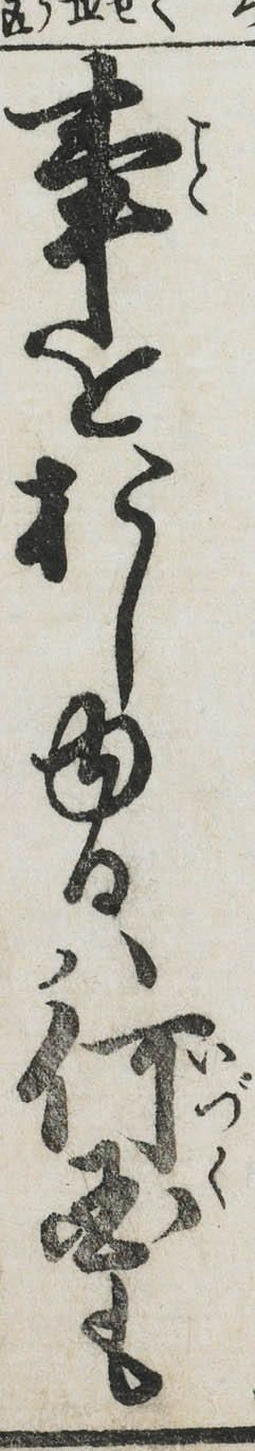事をおしゆるは何国も
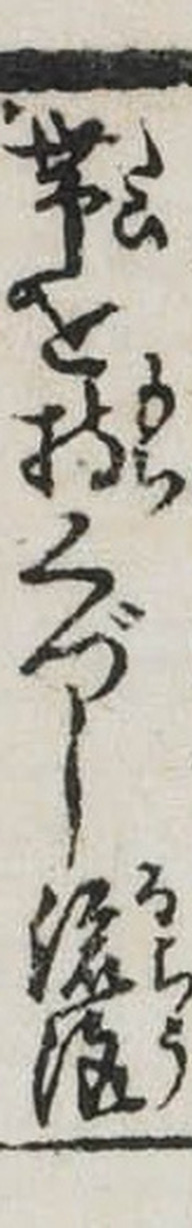帯を持くづし流浪
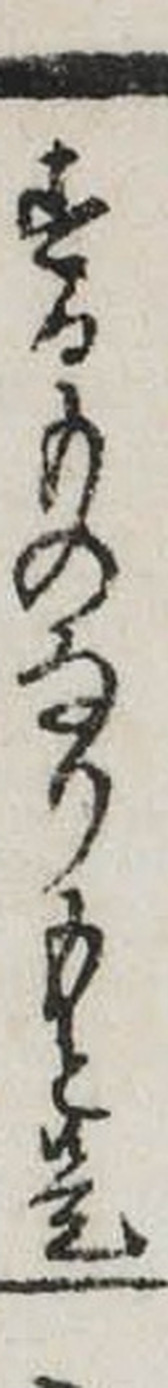するものなりもと是
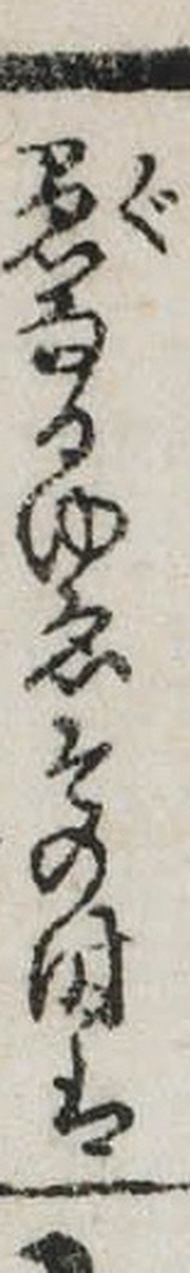愚なるゆゑその時は
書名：頭書萬用婦人手紙之文言
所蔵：東京学芸大学教育コンテンツアーカイブ
